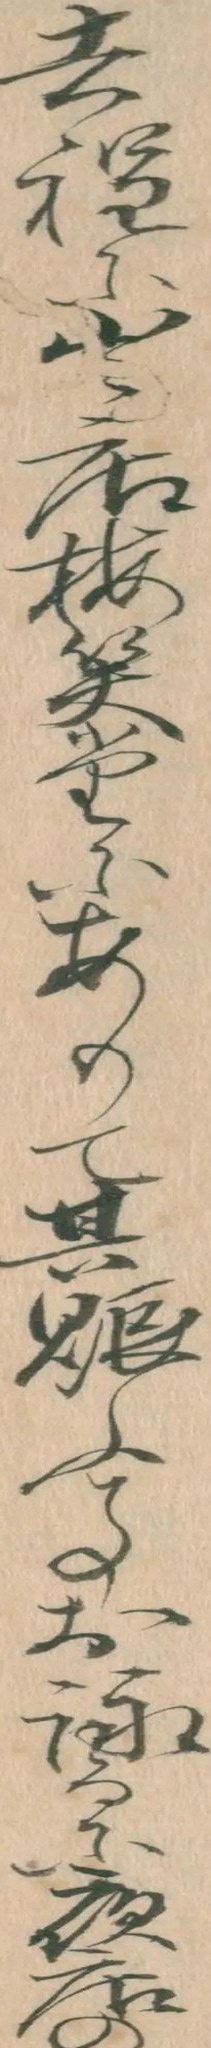去程に出店梅笑堂にありて其賑ふ事お詠るに夜店の
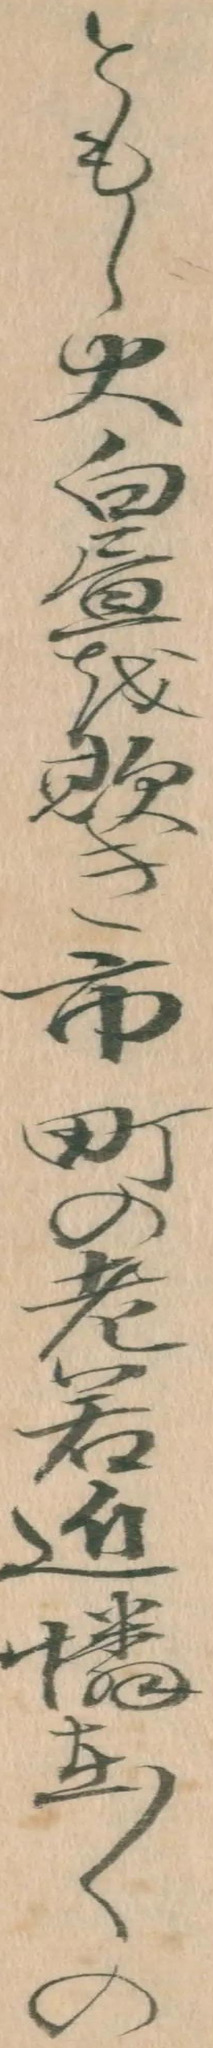ともし火白昼を欺き市町の老若近憐在〳〵の
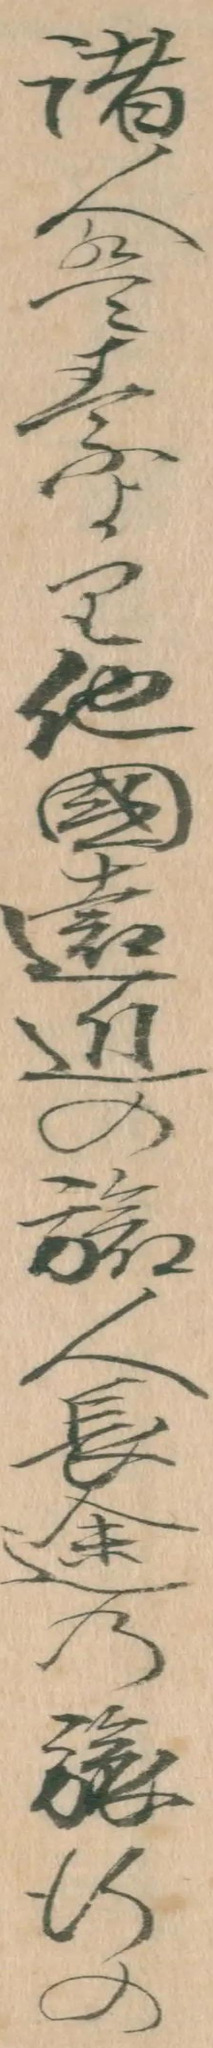諸人は素より他国遠近の旅人長途の旅行の
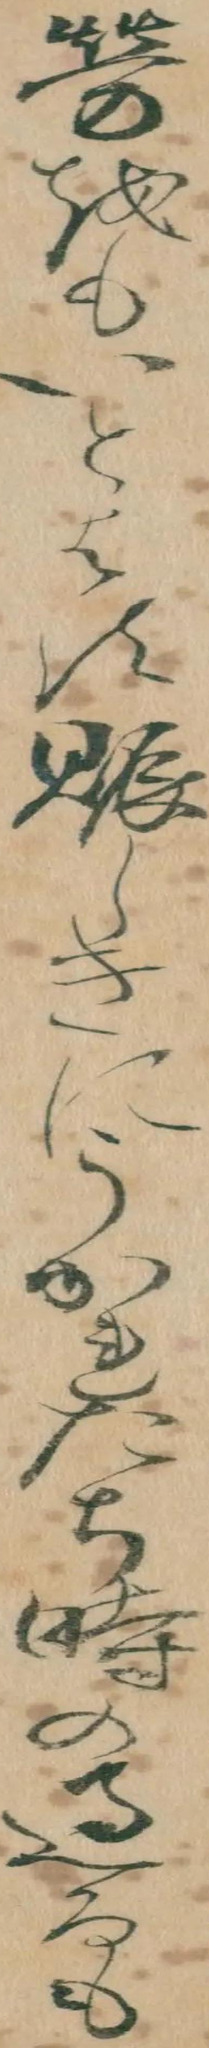労をもいとはす賑しきにうかれたち時の過るも
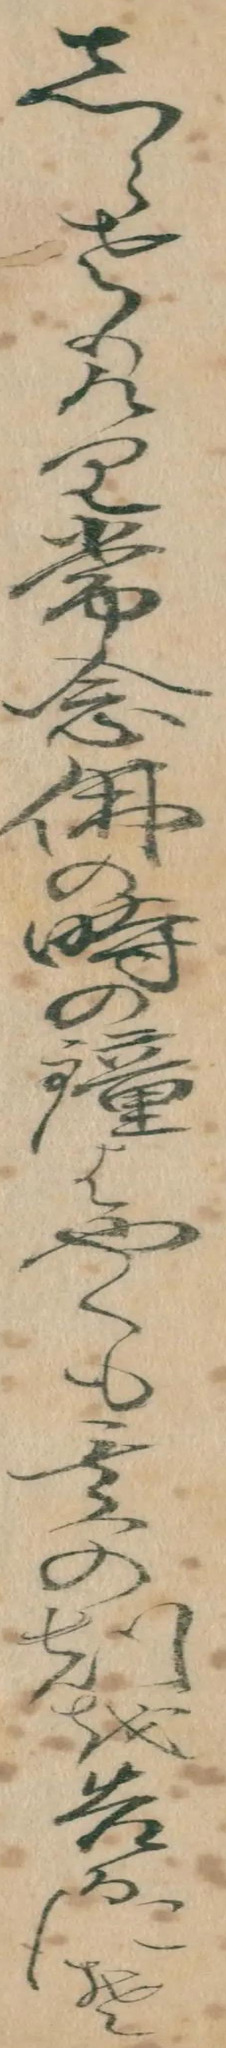しらさりけり常念仏の時の鐘はやくも亥の刻を告るにそ
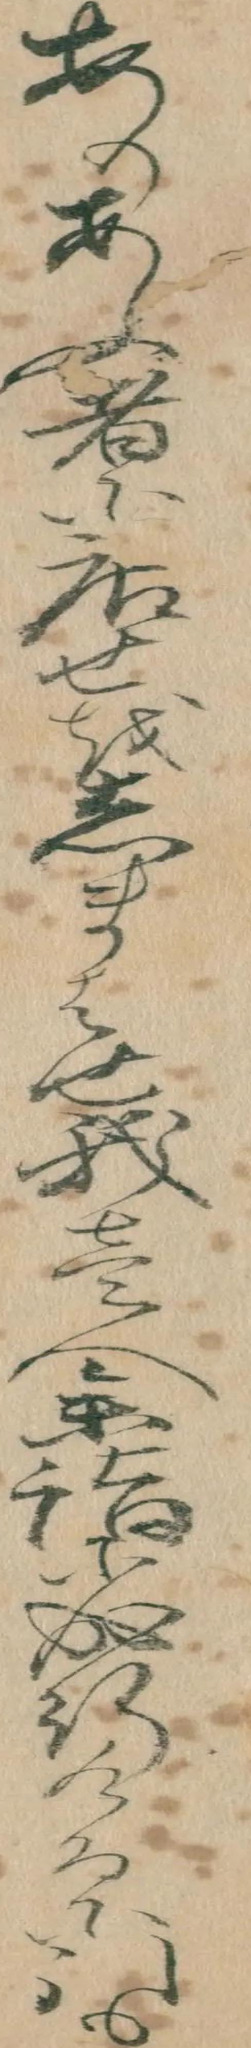ありあふ者に店せをしまはせ我壱人参詣に成行けるに引も
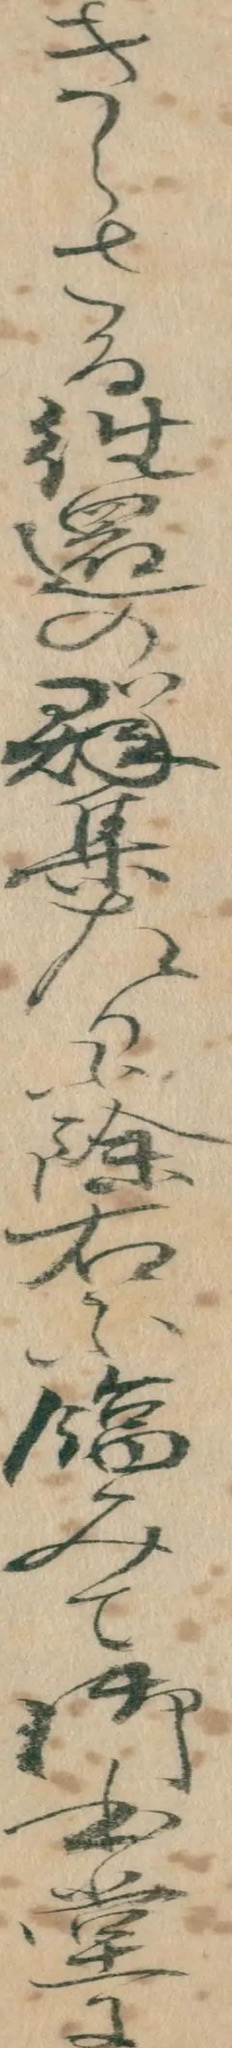きらさる往還の群集左りに除右に臨みて御本堂に
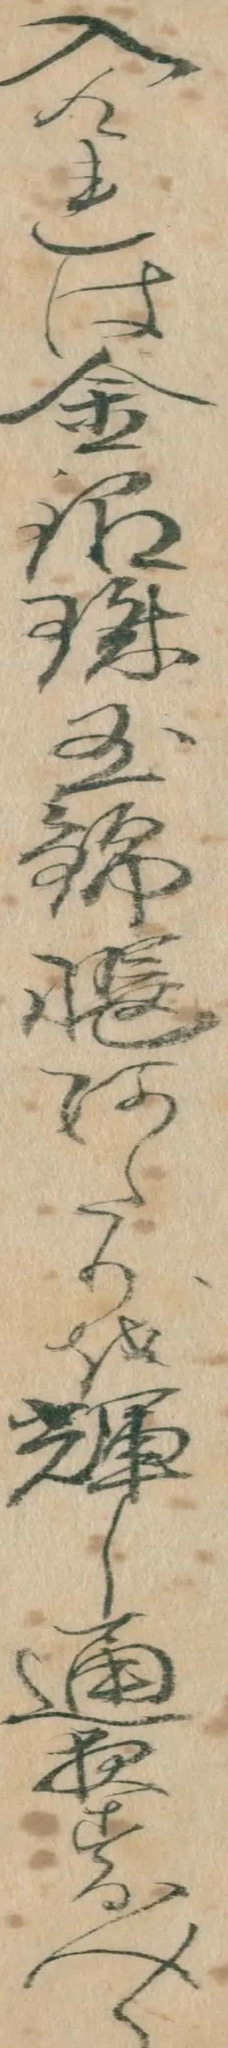入けれは金銀珠玉錦帳あたりを輝し通夜するへく
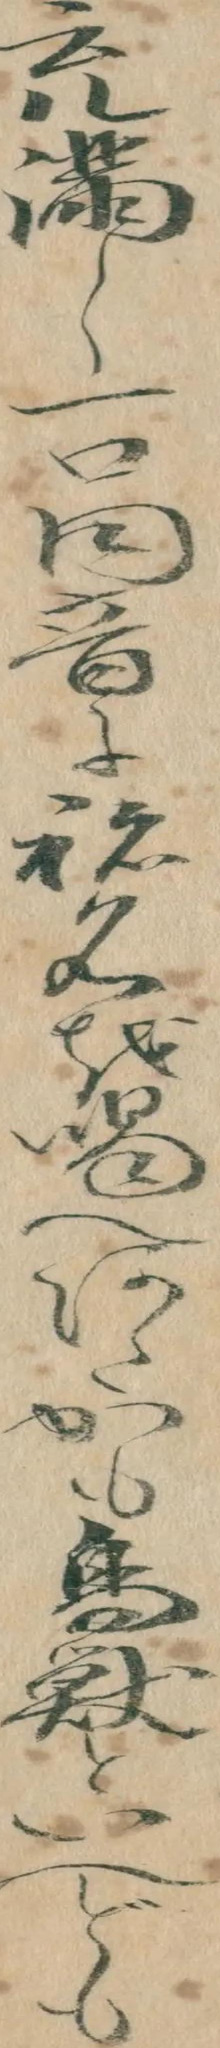充満し一口同音に称名を唱へあたかも鳥獣といへども
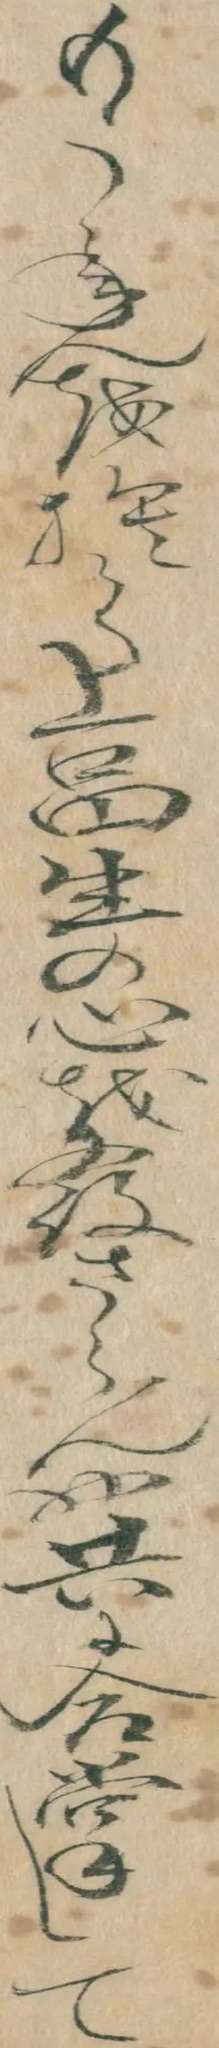もうねんを捨て上品生の心を発さらんや共に合掌して
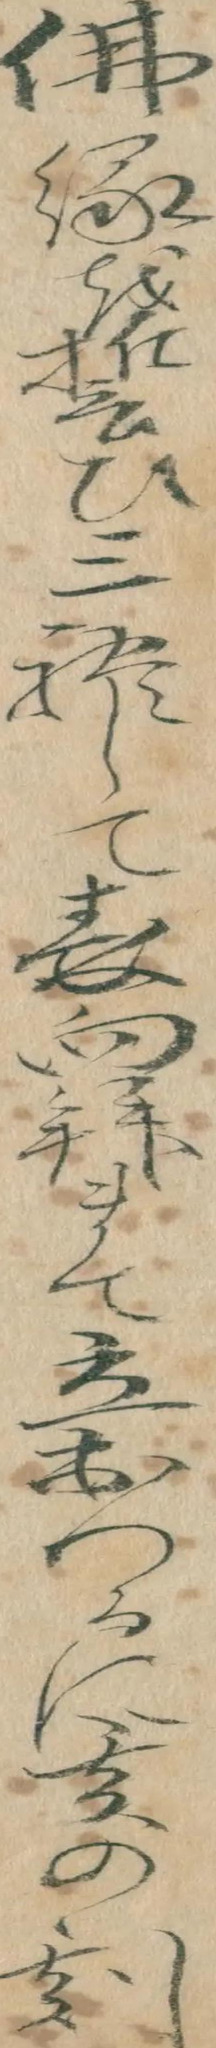仏縁を誓ひ三礼して表向拝まて立出つるに亥の刻
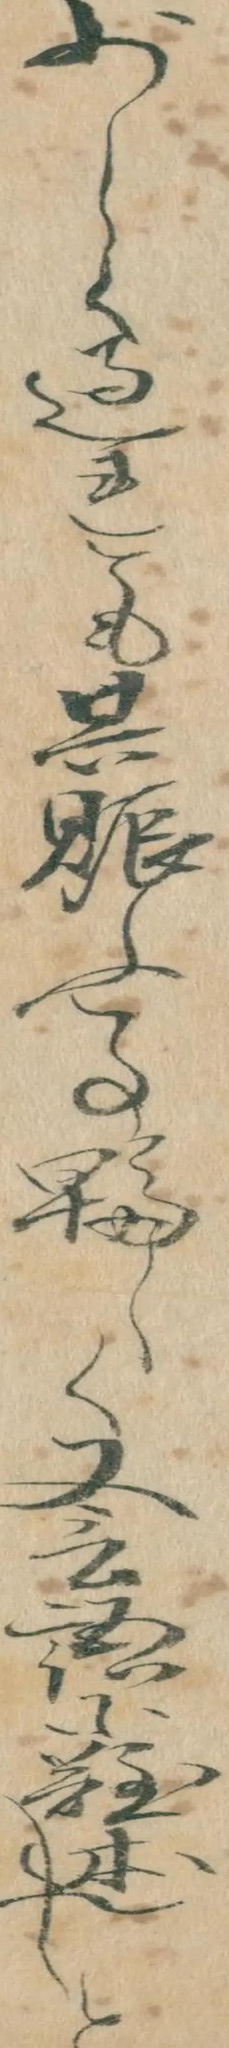少しく過れとも其賑ふ事夥しく又云語に難述しと
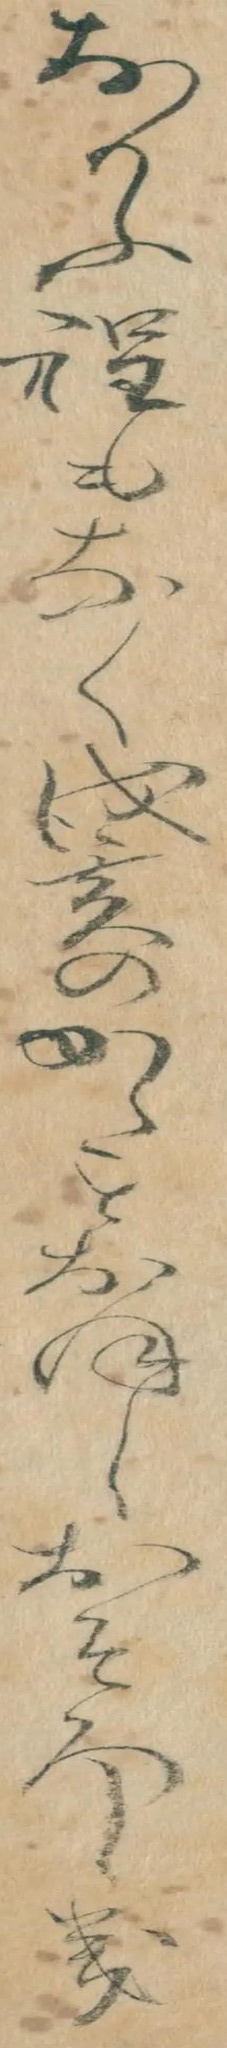おもふ程もなく戌亥のかたとおほしおそろしき

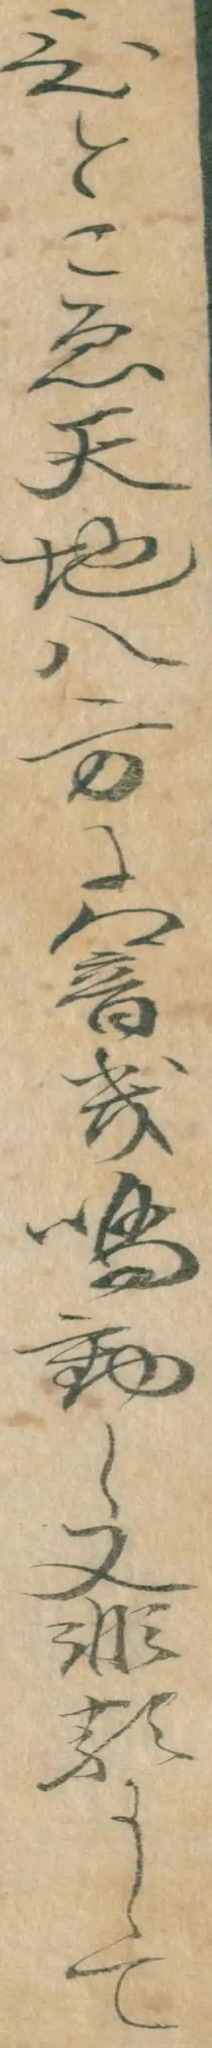ひとこゑ天地八方に響き鳴動し又非類にして
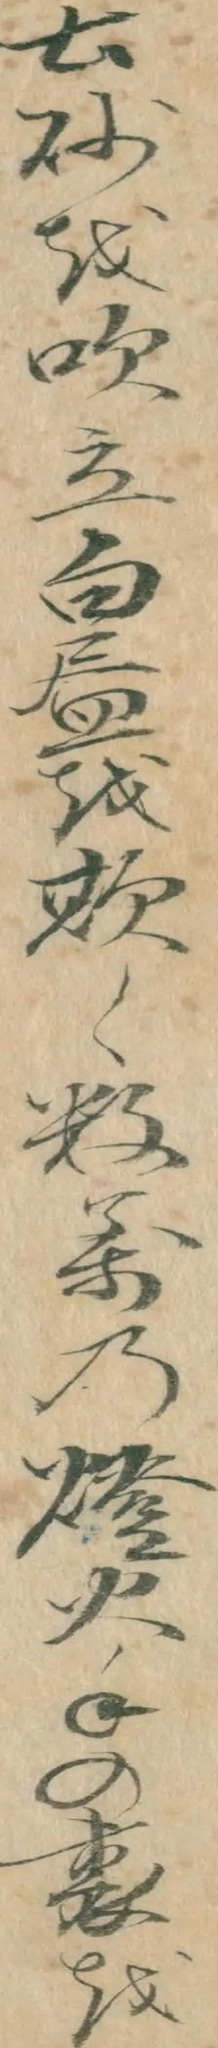土砂を吹立白昼を欺く数万の灯火手の裏を
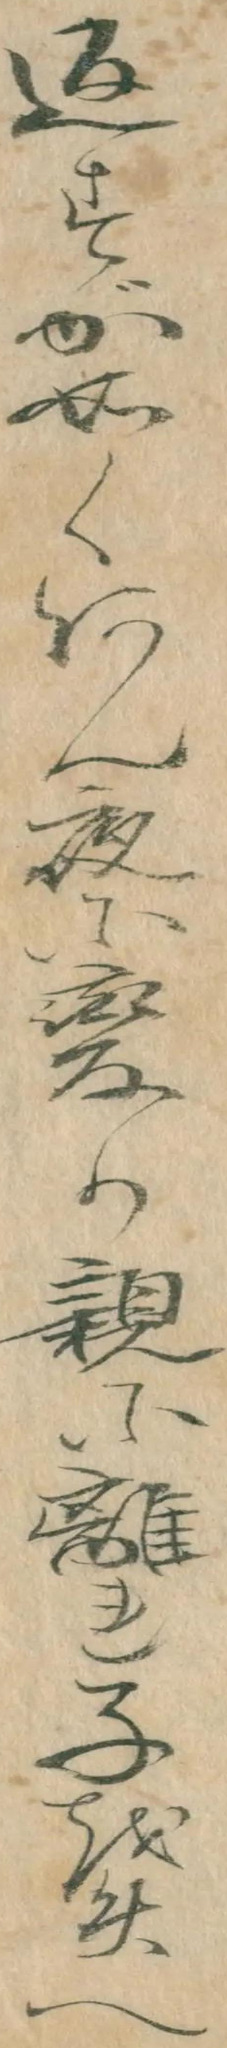返すが如くあん夜に変り親に離れ子を失へ
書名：俗語之種. [3]
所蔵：国立国会図書館 National Diet Library, JAPAN
